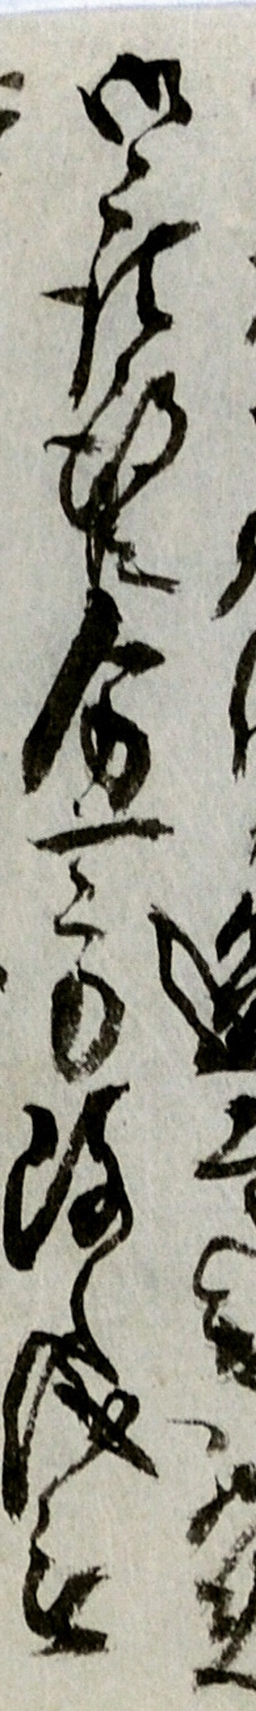御座候得共分一方改之儀被
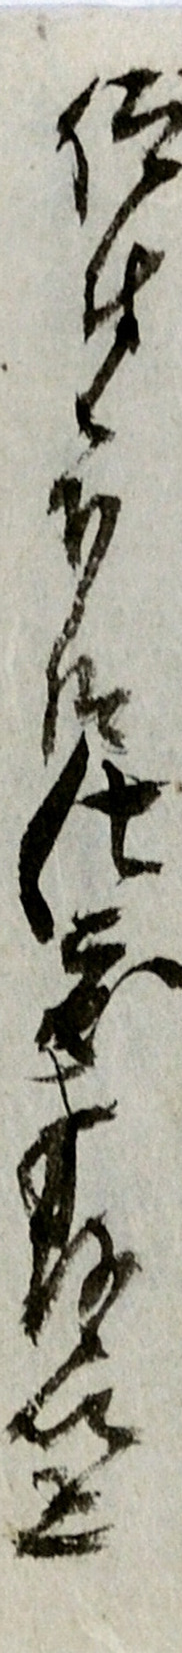仰付被下候様仕度奉存候以上
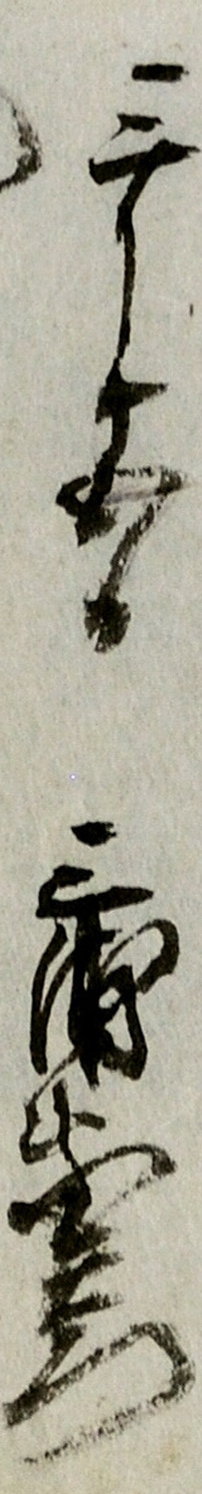三月十五日三浦団右衛門
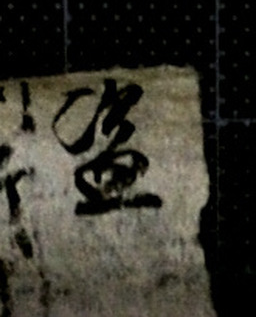十五日
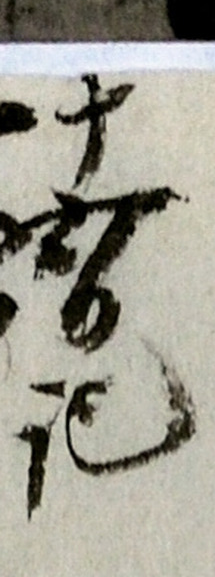十五日記
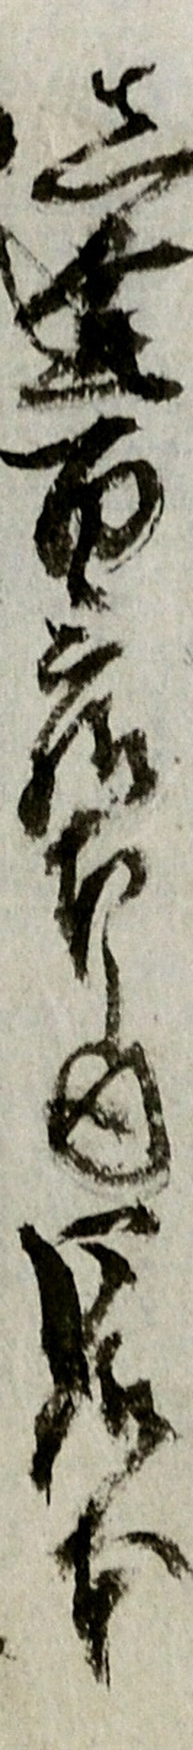先達百三拾本之内四拾本
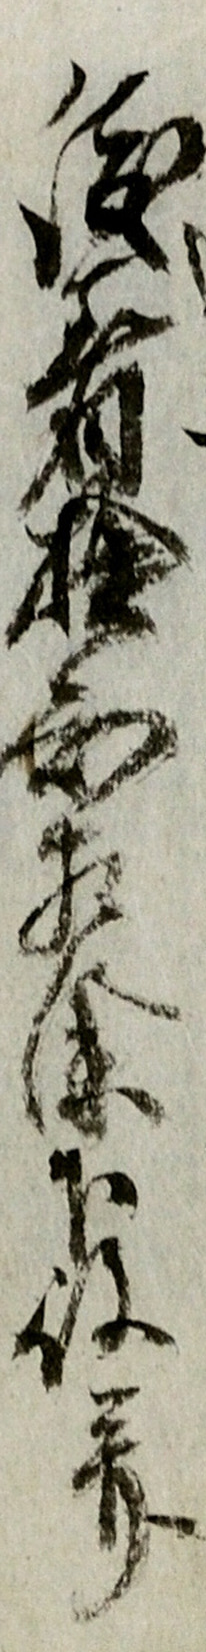渡着検知相済下役并
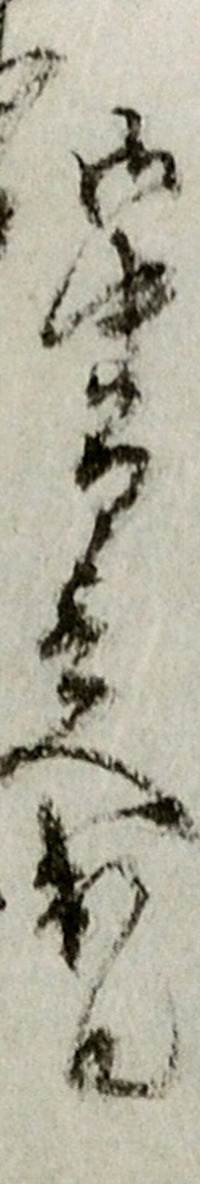御中間壱人出ル
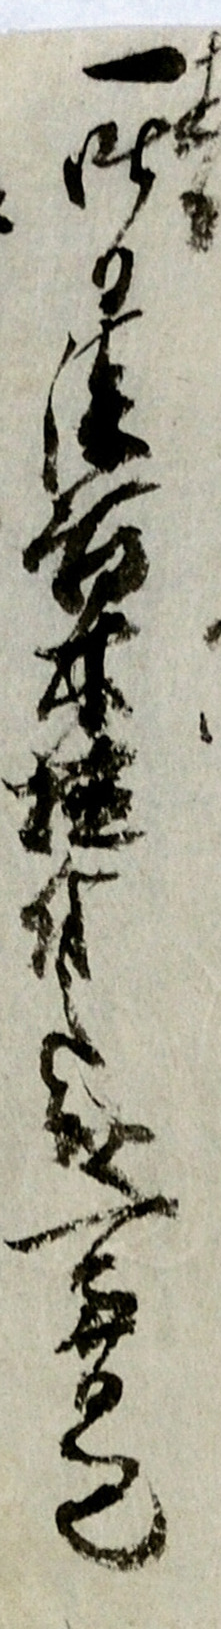一昨日漆苗木植付之義一両日迄
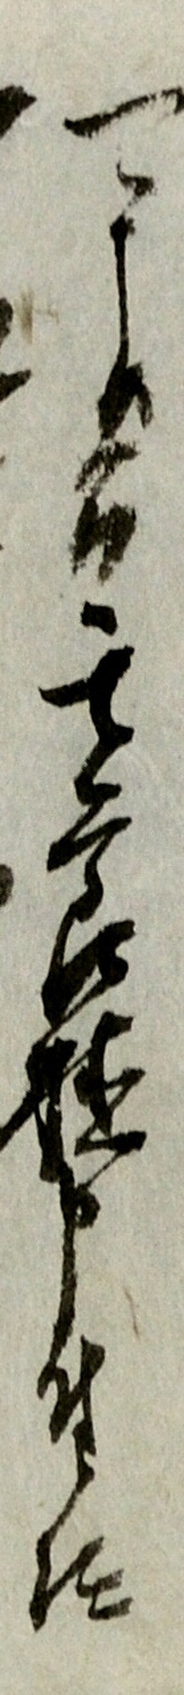可申候間其節植申付候様
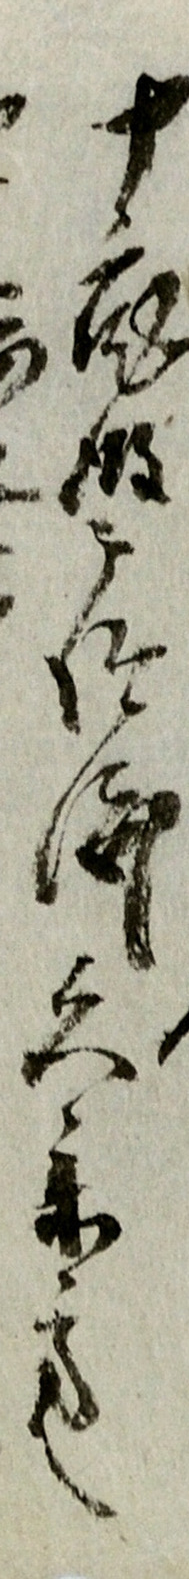十蔵殿被仰渡久兵衛方へ
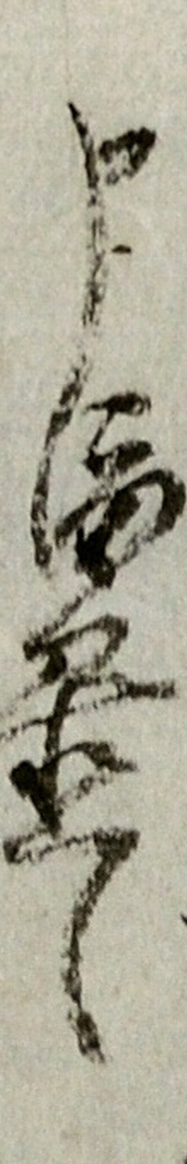申渡置候
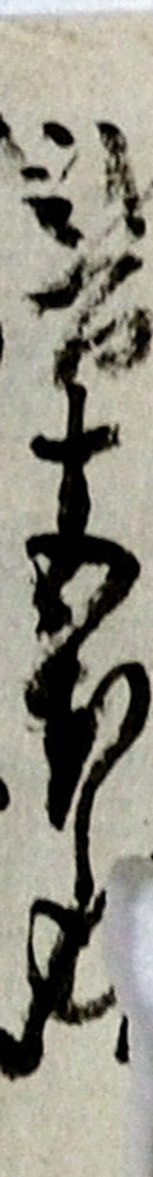弐百十五本之内
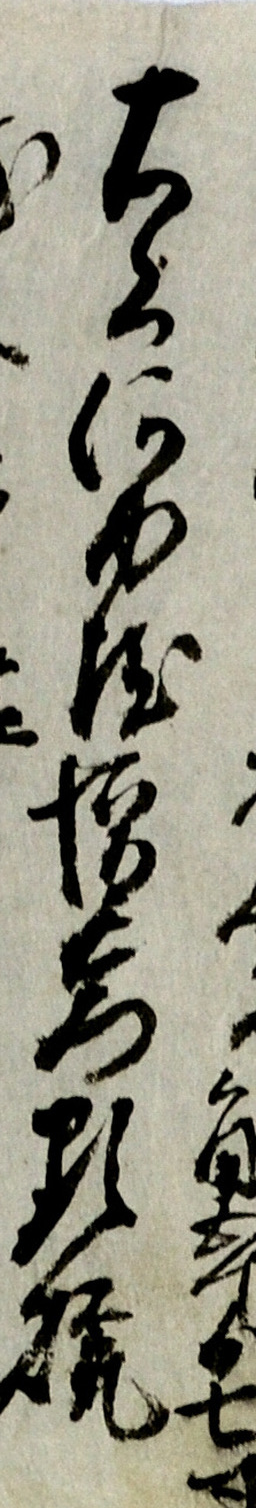右は河内屋増右衛門類焼
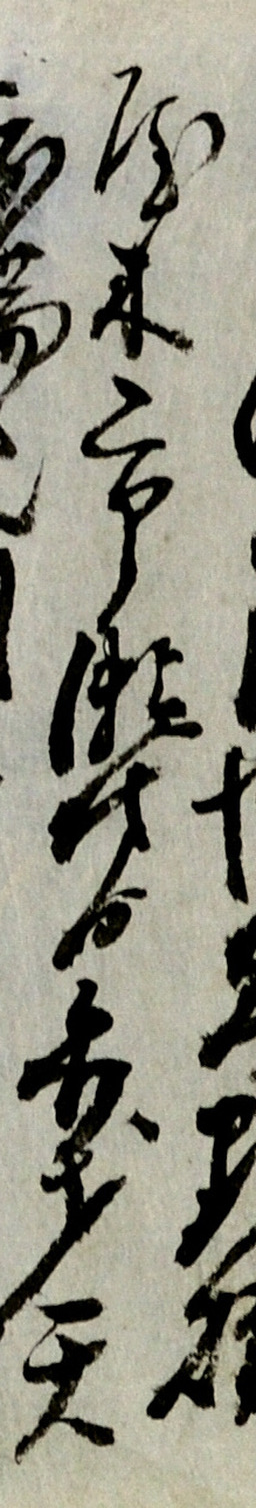屋木市之瀬村ゟ弁才天
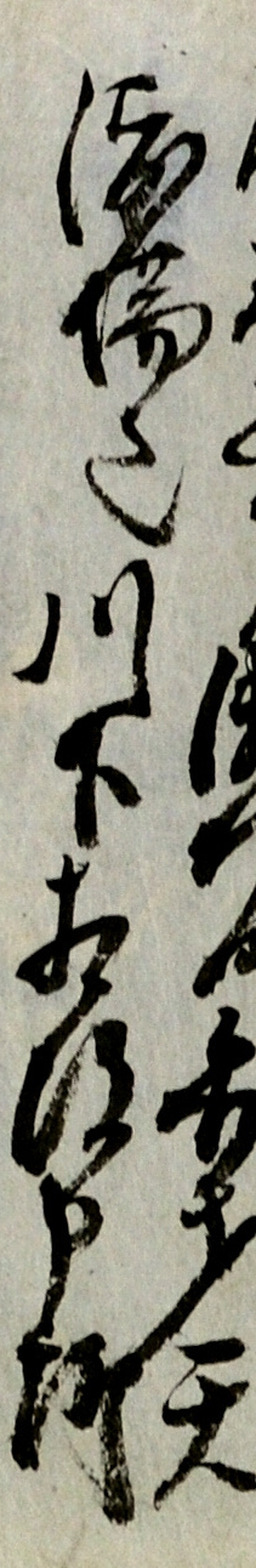渡場迄川下相改申所
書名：分一方諸事御用留帳
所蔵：伊那市立高遠町図書館・合同会社AMANE
